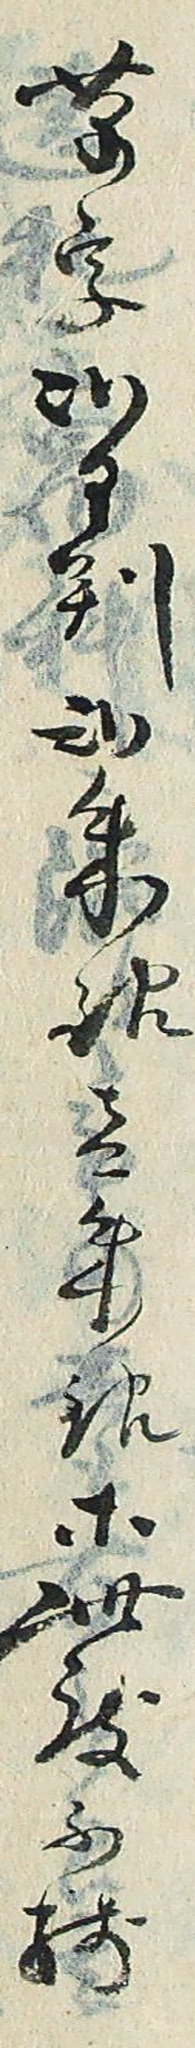草字弐分判弐朱銀壱朱銀等此度不残
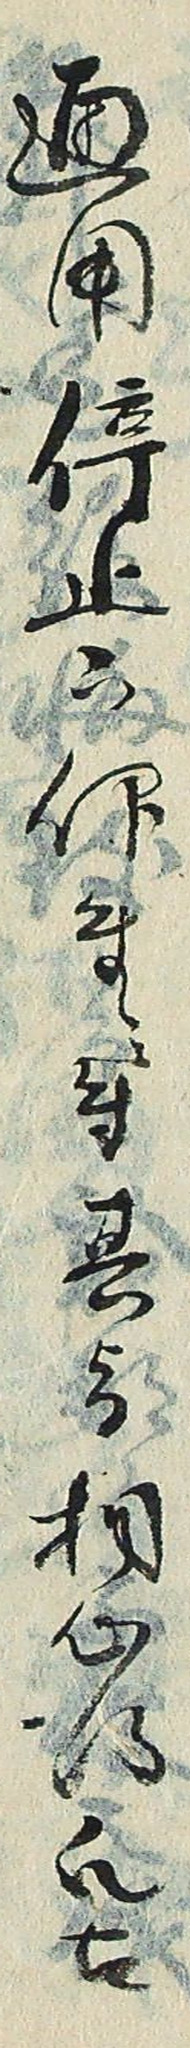通用停止被仰付候に付其旨相心得凡古
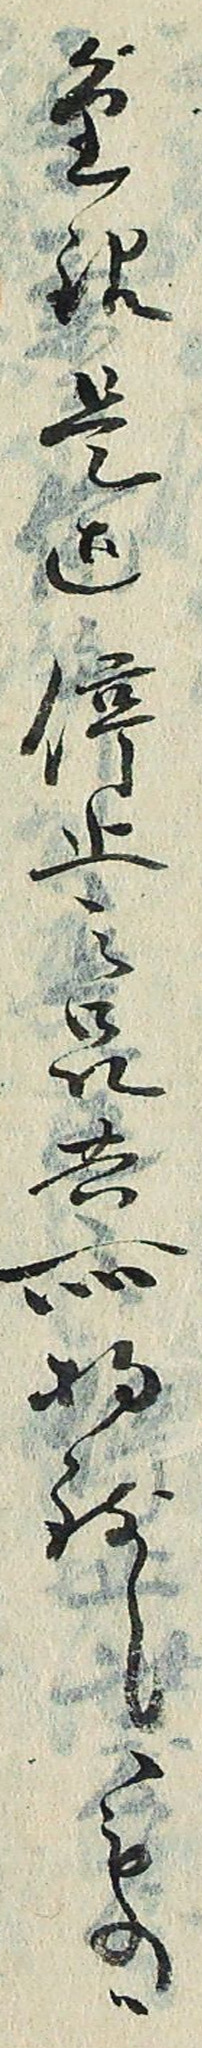金銀是迄停止之品共所持致し候ものは
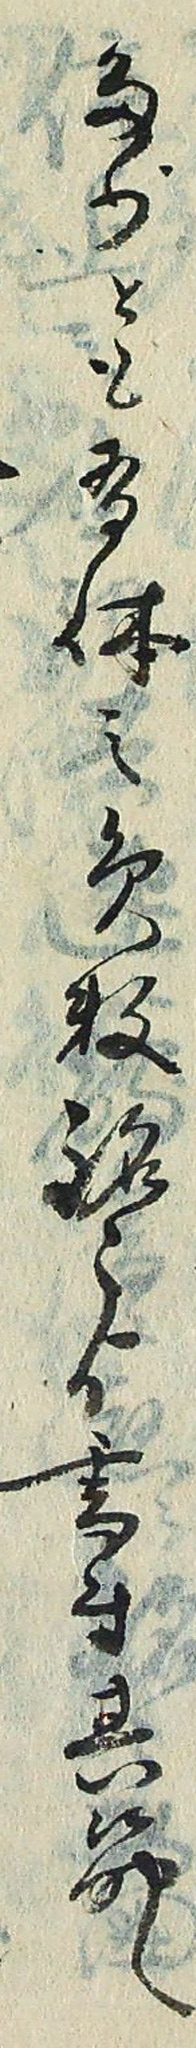多少とも有体之員数銘々ゟ書付其筋へ
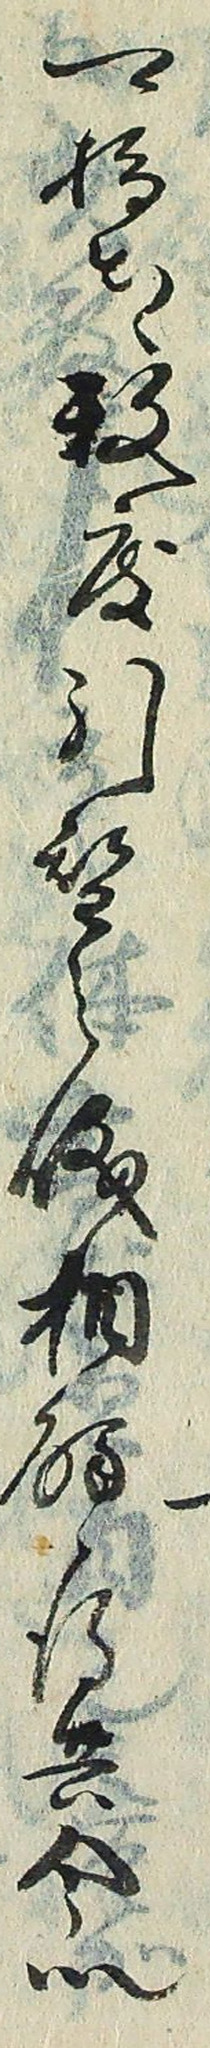可指出候数度引替之儀相触候得共今以
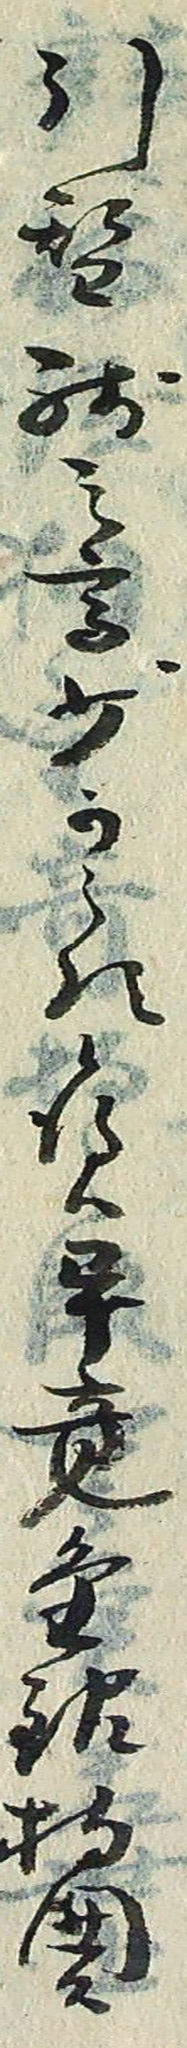引替残之高少からす候得は畢竟金銀持囲候
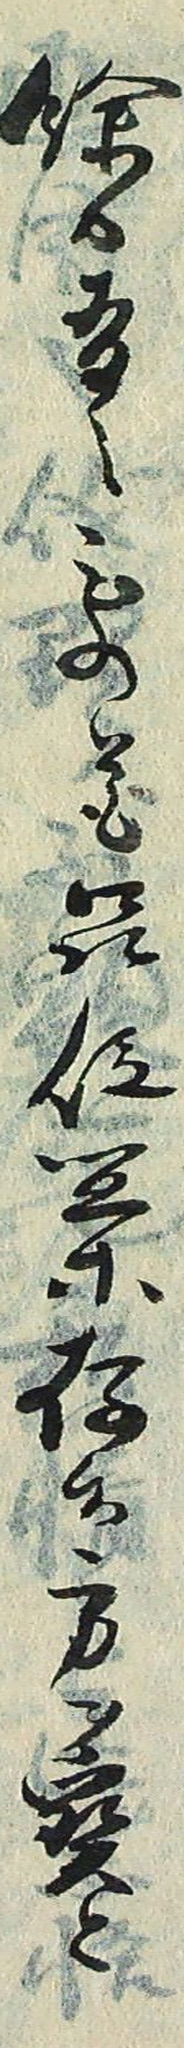余日有之ものとも品位宜等存候方を宝と
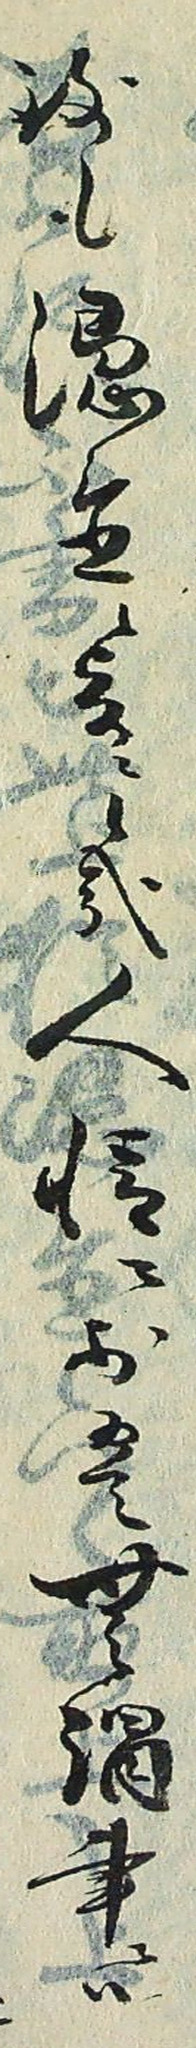致も隠置候旨に候哉人情に於有之無謂事には
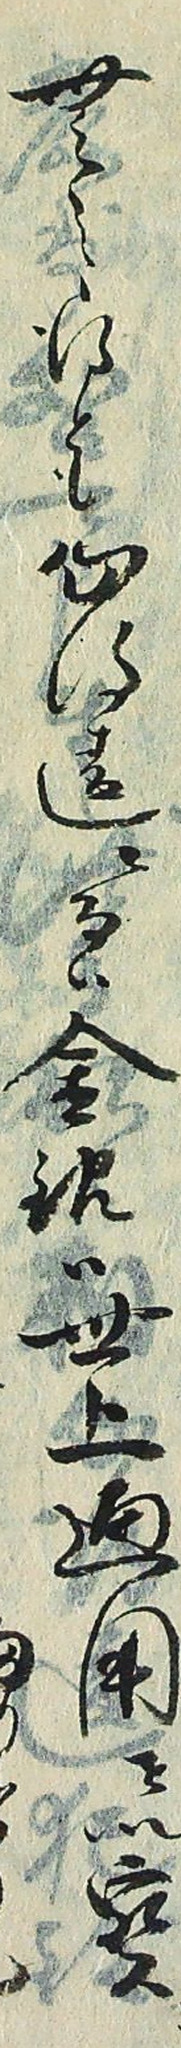無之候得とも心得違に而は金銀は世上通用を以宝と
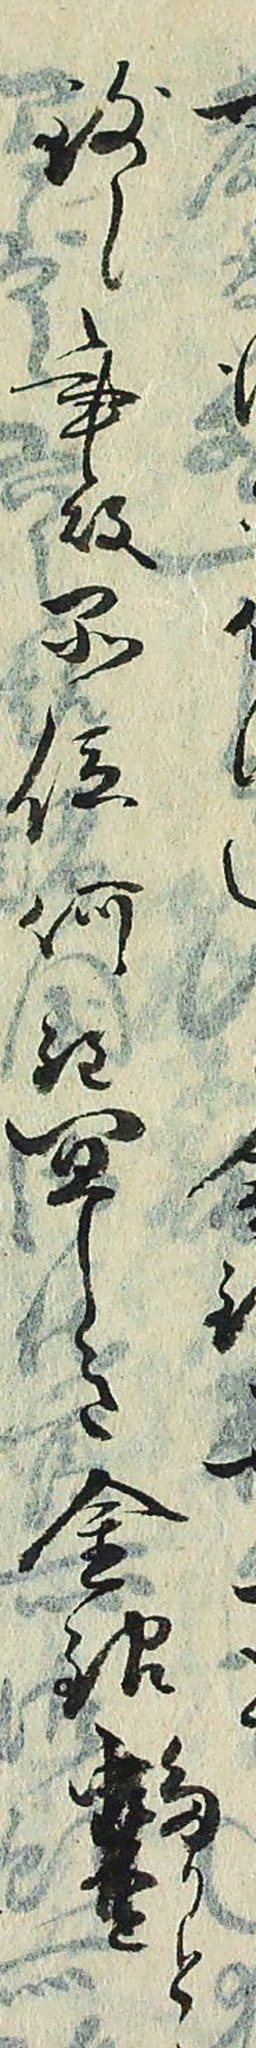致し候事故品位何程宜しき金銀たりとも
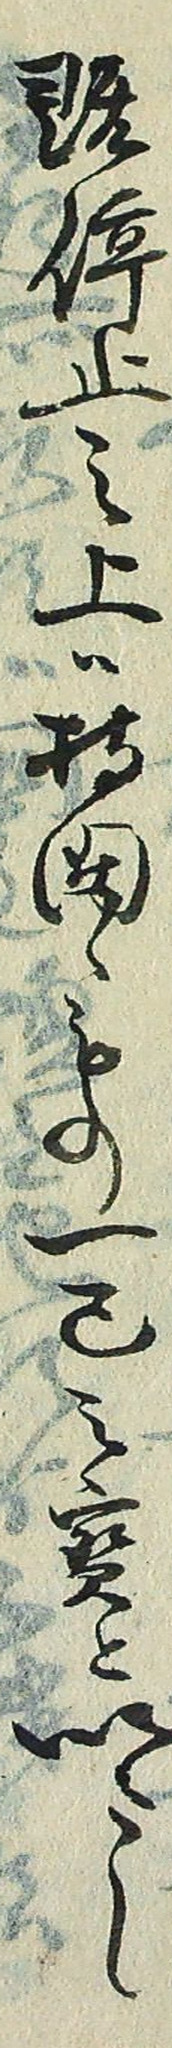既停止之上は持囲候もの一己之宝といたし
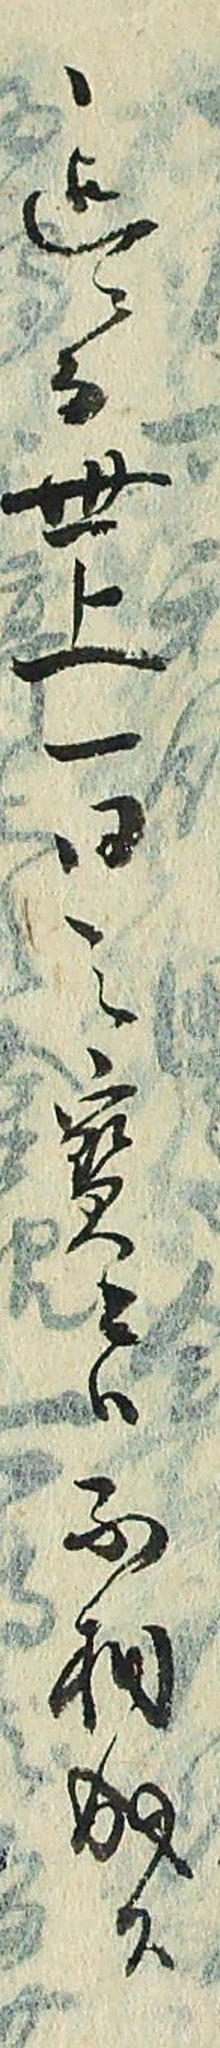候迄に而世上一同之宝とは不相成候
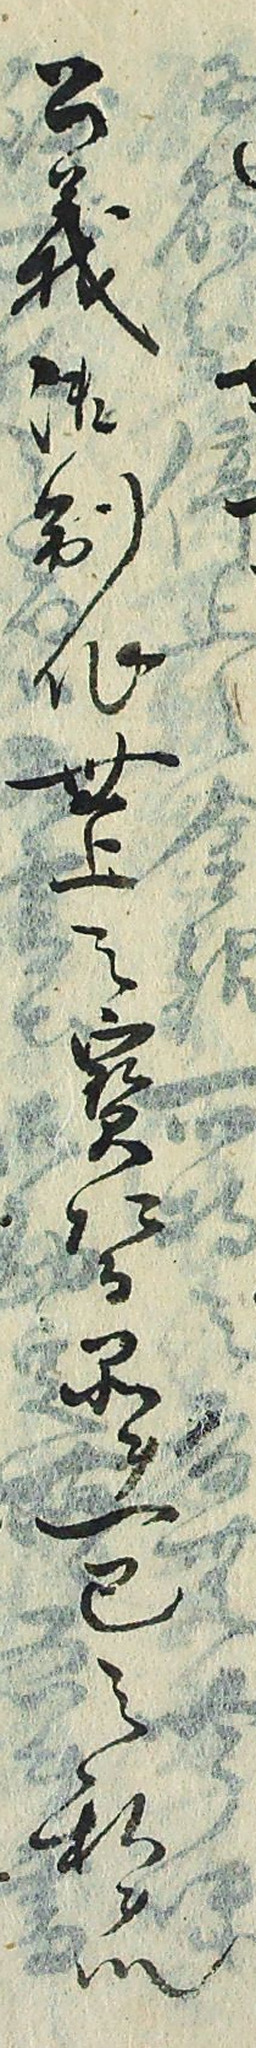公義御制作世上之宝たる品を一己之私を以
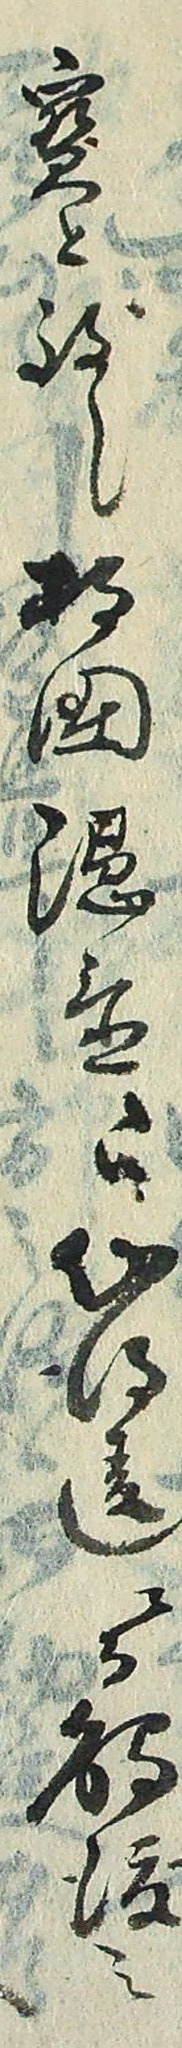宝と致し持囲隠置候は心得違に而触渡之
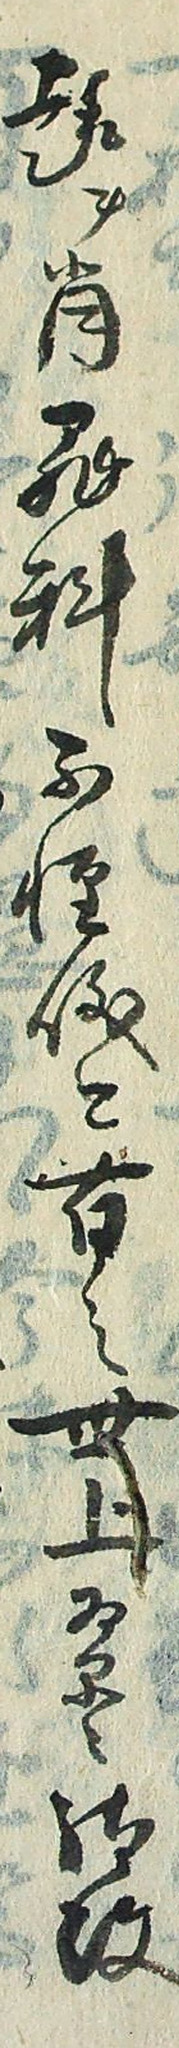趣を背罪科不軽儀に有之世上為品々御改
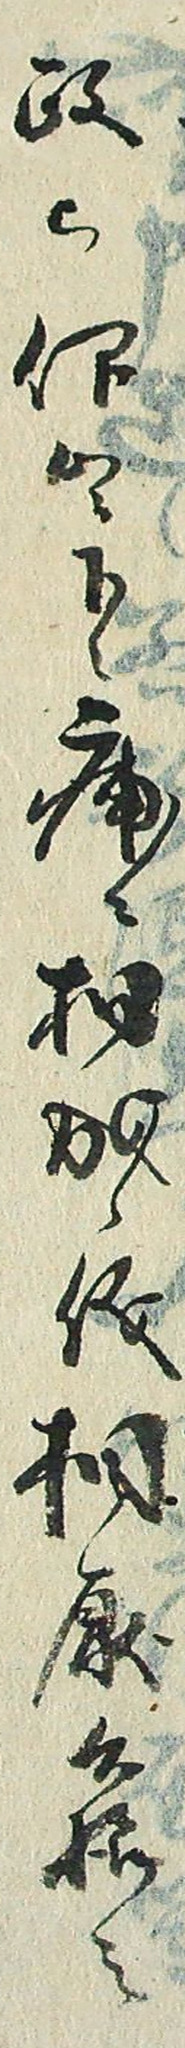政被仰出候下々痛に相成候儀厭候様之
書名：諸御用御□受書控
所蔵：鳴門教育大学 Naruto University of Education
